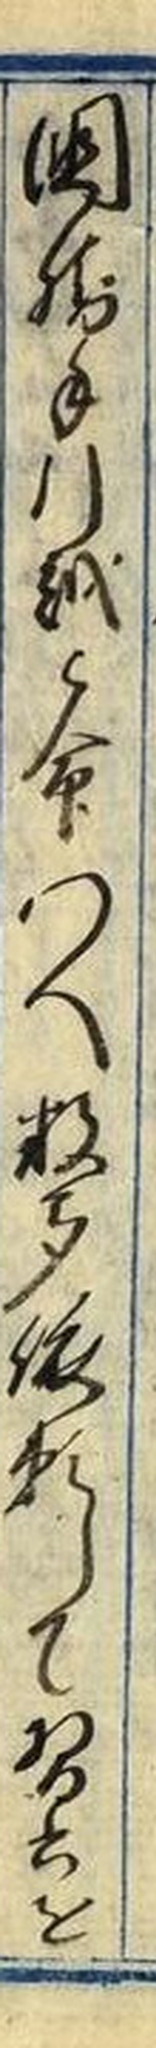国勝手引越被命門人数多依頼して習書を
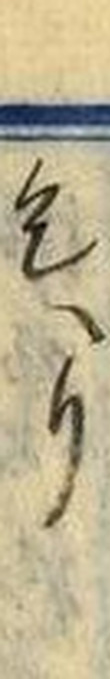乞へり

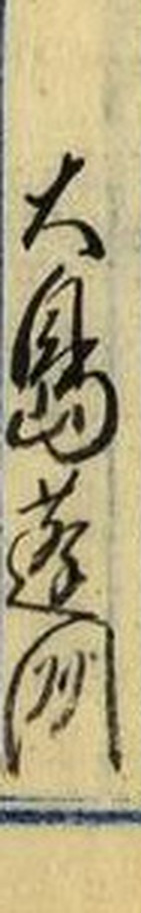大島蓬洲
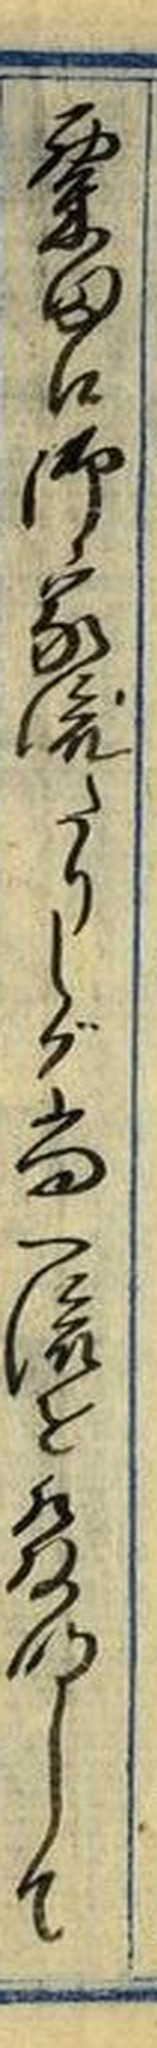粟田口御家流たりしが尚一流を発明して
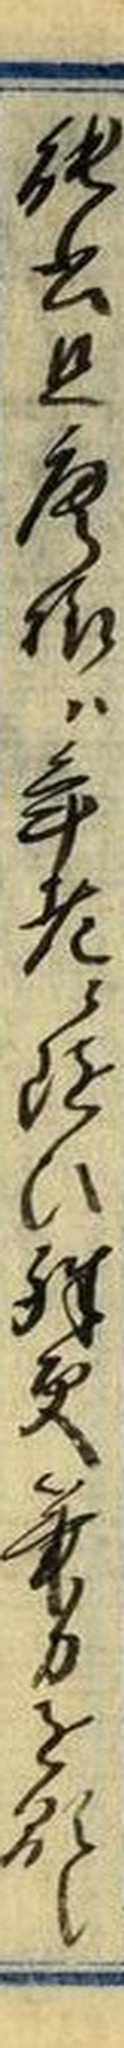能書且唐様は年老に随い殊更筆力を顕し
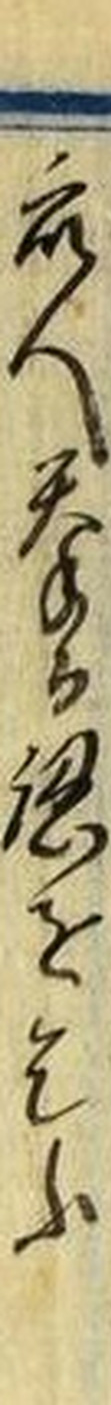衆人挙而認を乞ふ
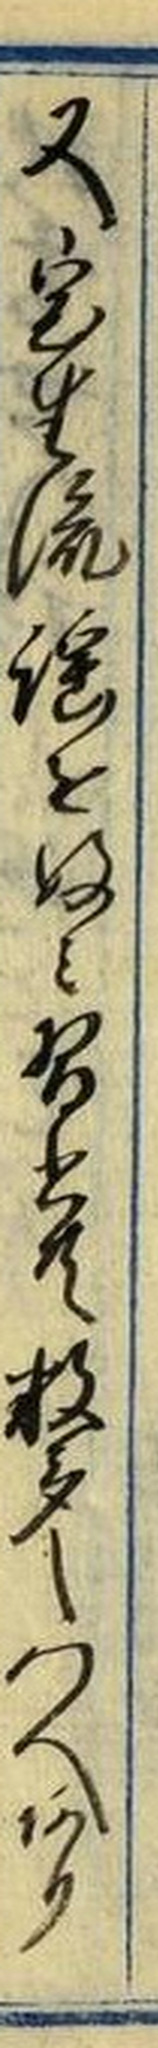又宝生流謡を好み習書共数多之門人あり
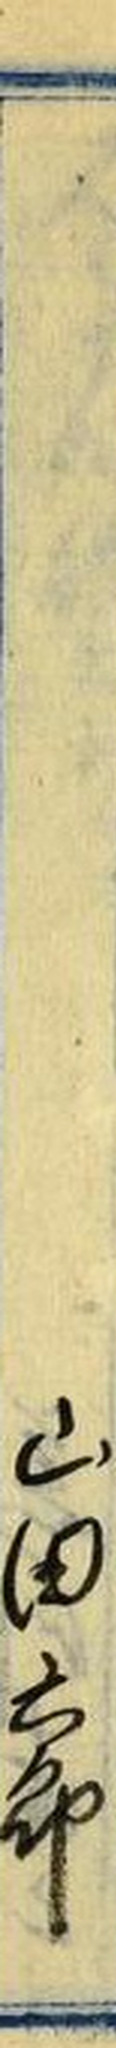山田六郎
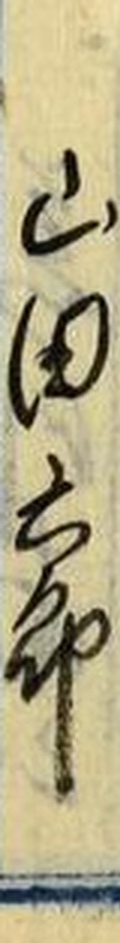山田六郎
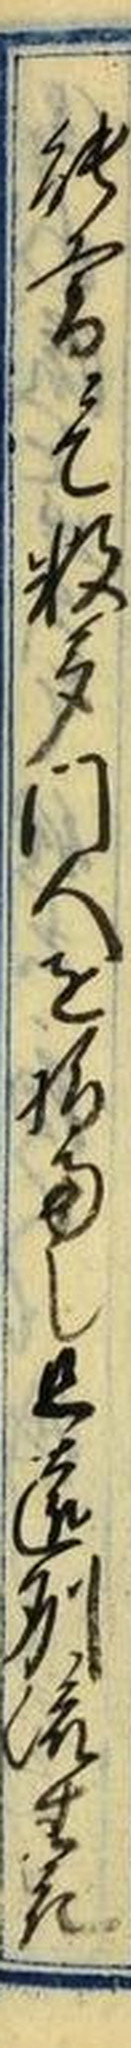能書にて数多門人を指南し且遠州流生花
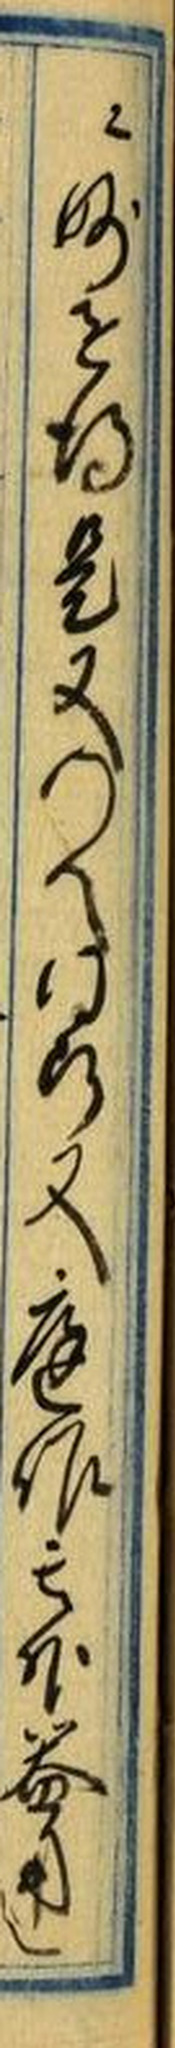に妙を得是又門人同断又庭作其外器用之
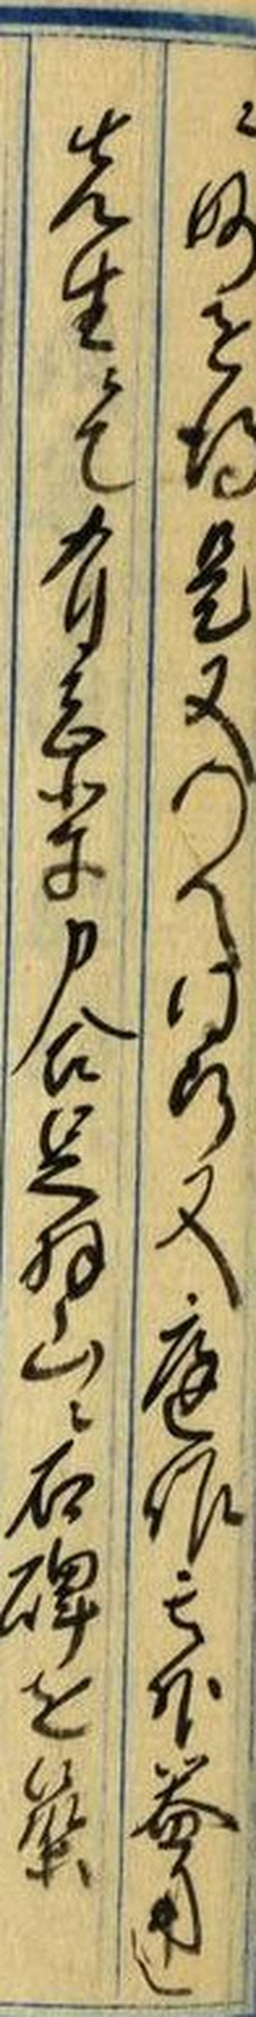先生にて有志輩申合足羽山に石碑を築

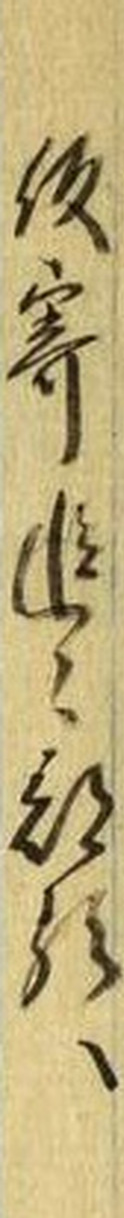仮寄進之部類へ
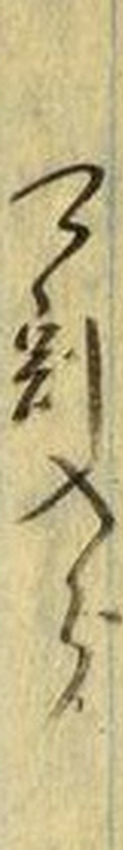可割入分
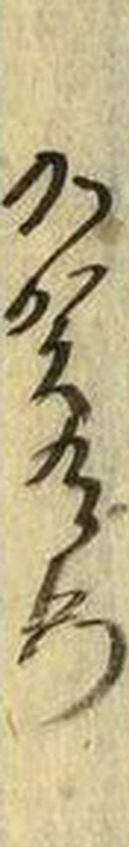加賀九郎右衛門
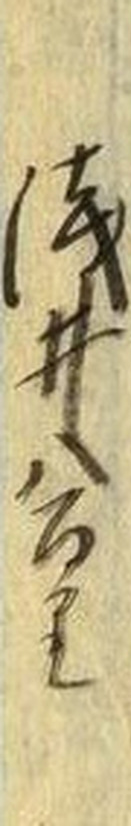浅井八百里
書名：温古集 四巻
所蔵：福井県文書館 Fukui Prefectural Archives
